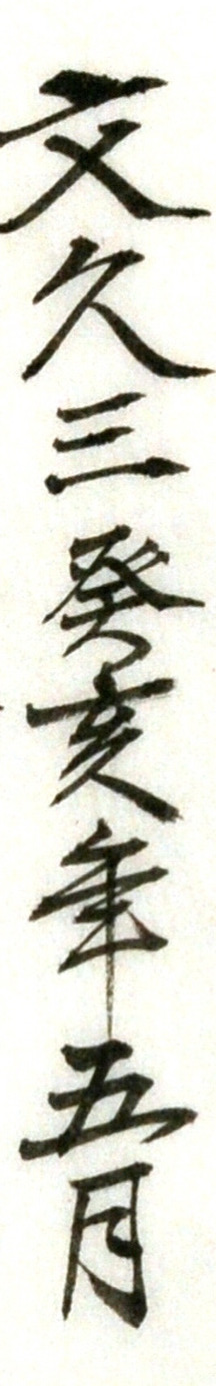文久癸亥年五月
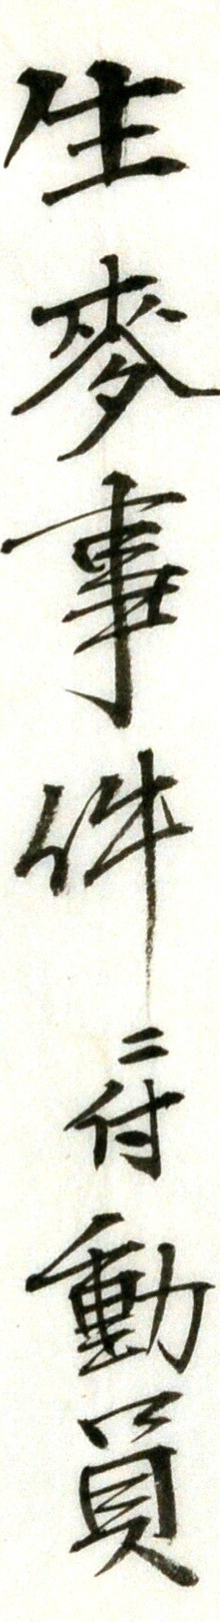生麦事件ニ付動員

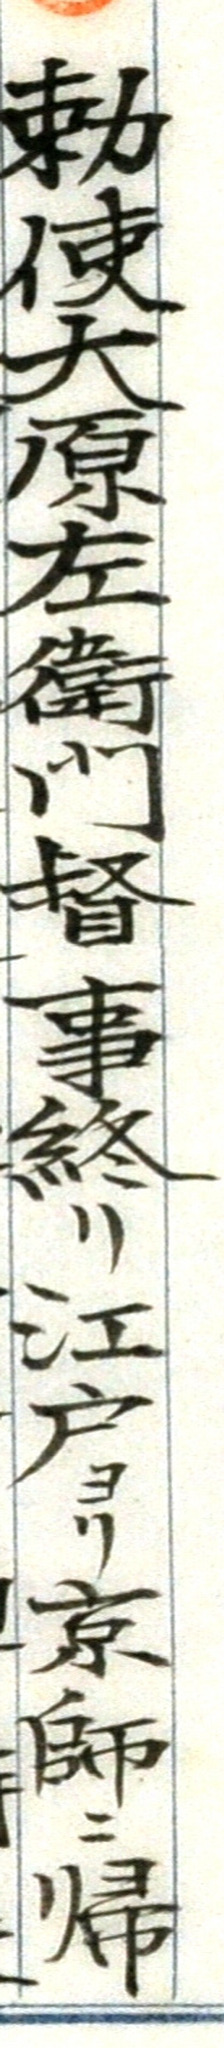勅使大原左衛門督事終リ江戸ヨリ京師二帰
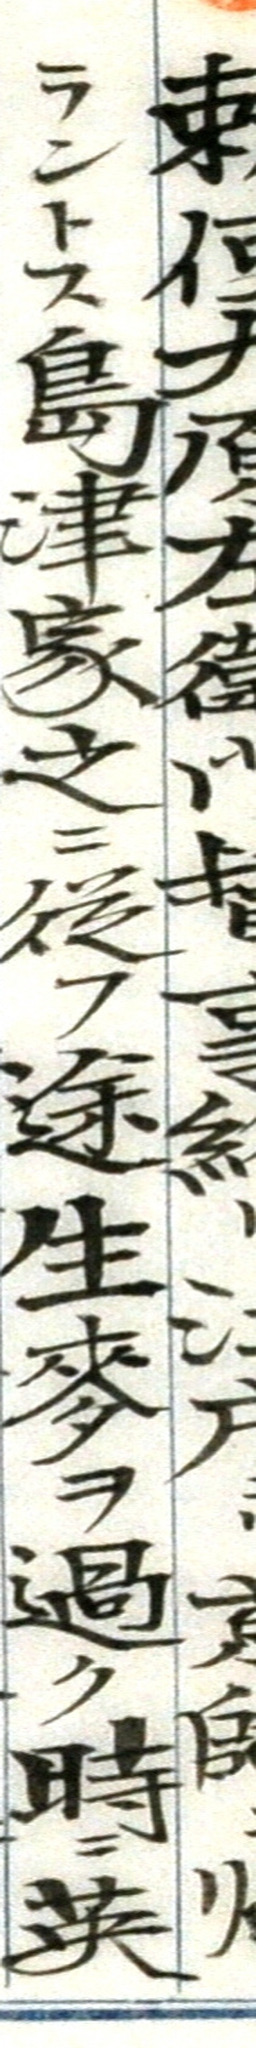ラントス島津家之二従フ途生麦ヲ過ク時二英
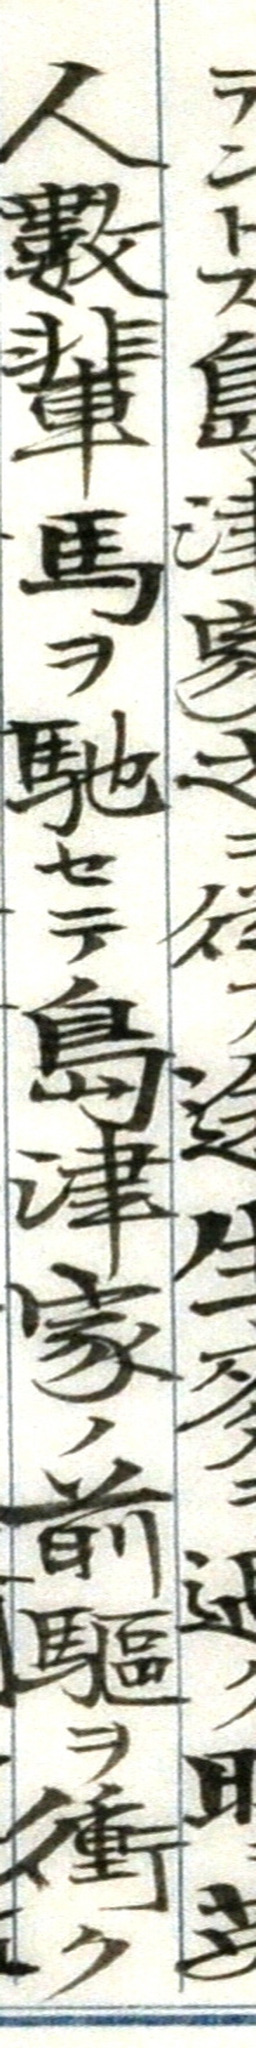人数輩馬ヲ馳セテ島津家ノ前駆ヲ衝ク
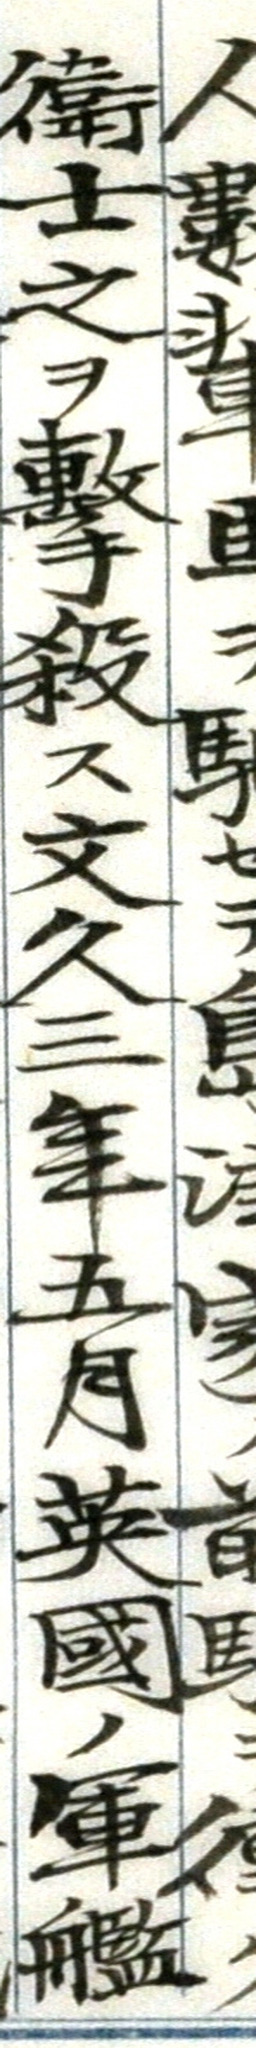衛士之ヲ撃殺ス文久三年五月英国ノ軍艦
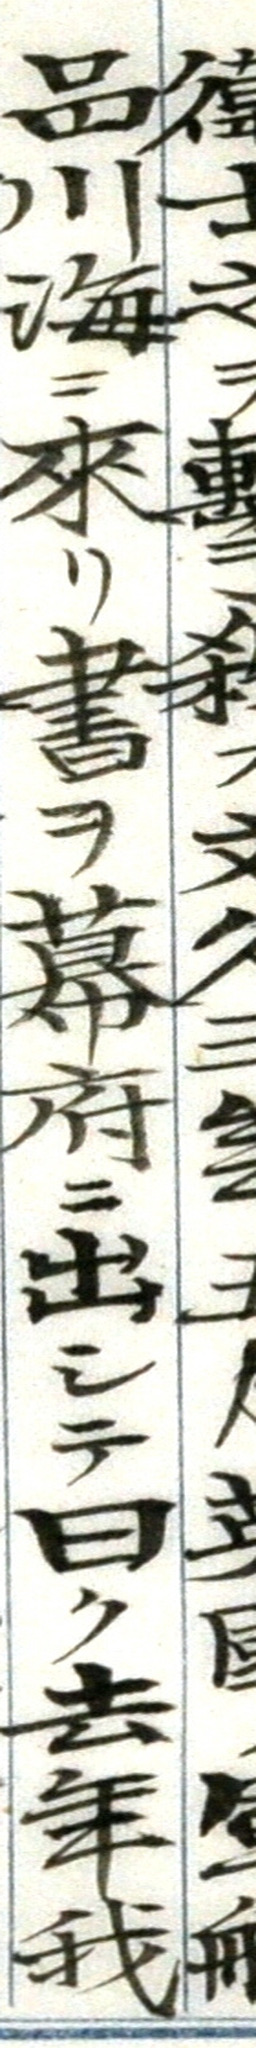品川海ニ来リ書ヲ幕府ニ出シテ曰ク去年我
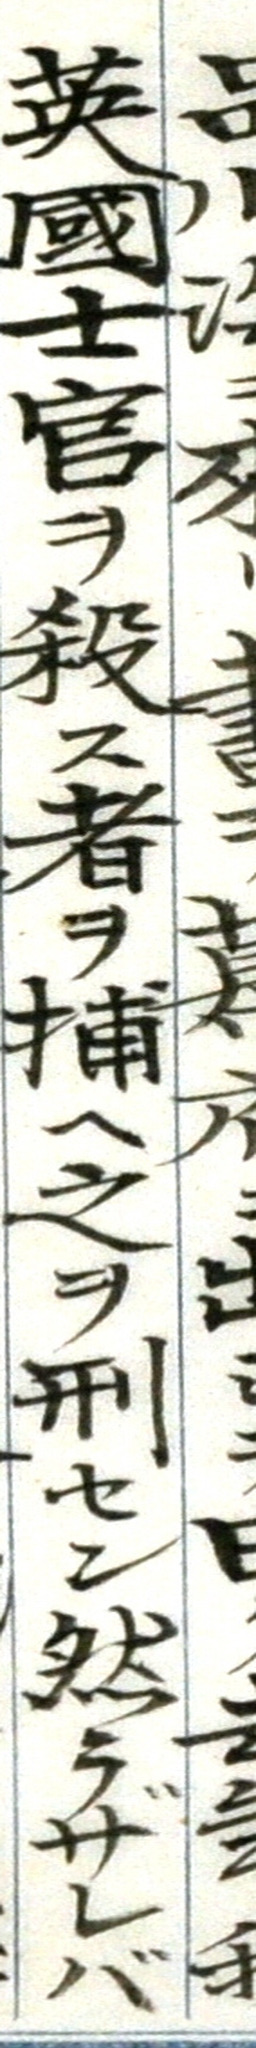英国士官ヲ殺ス者ヲ捕ヘ之ヲ刑セン然ラザレバ
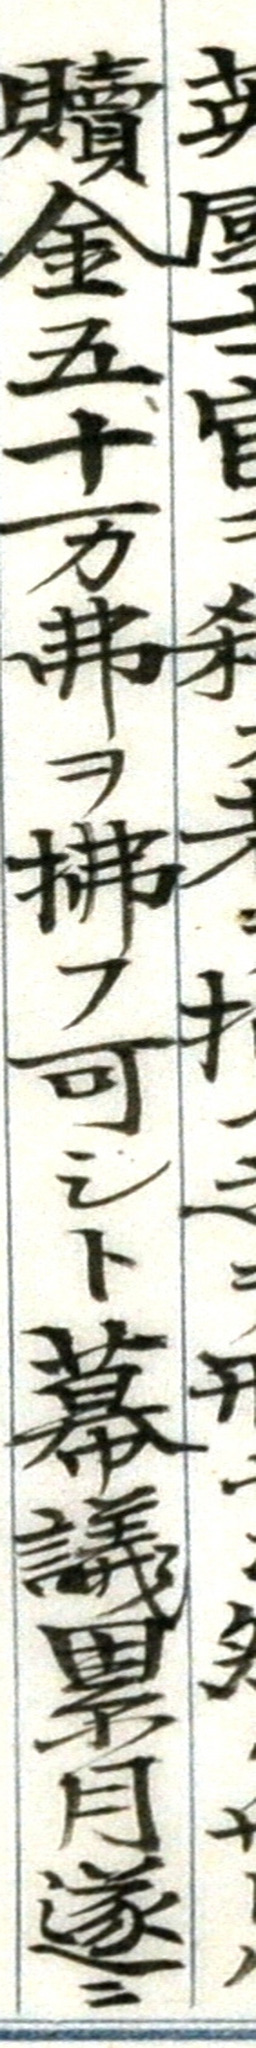贖金五十万弗ヲ払フ可シト幕議累月遂ニ
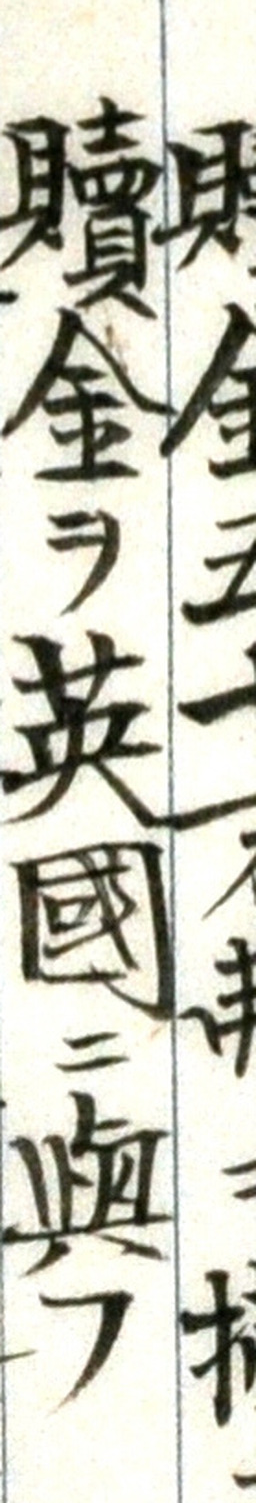贖金ヲ英国ニ与フ
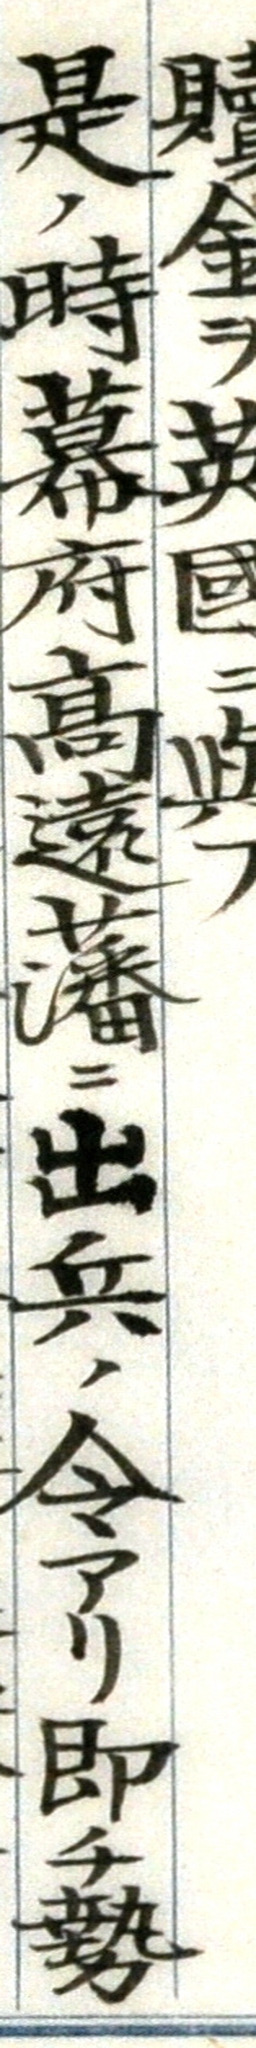是ノ時幕府高遠藩ニ出兵ノ令アリ即チ勢
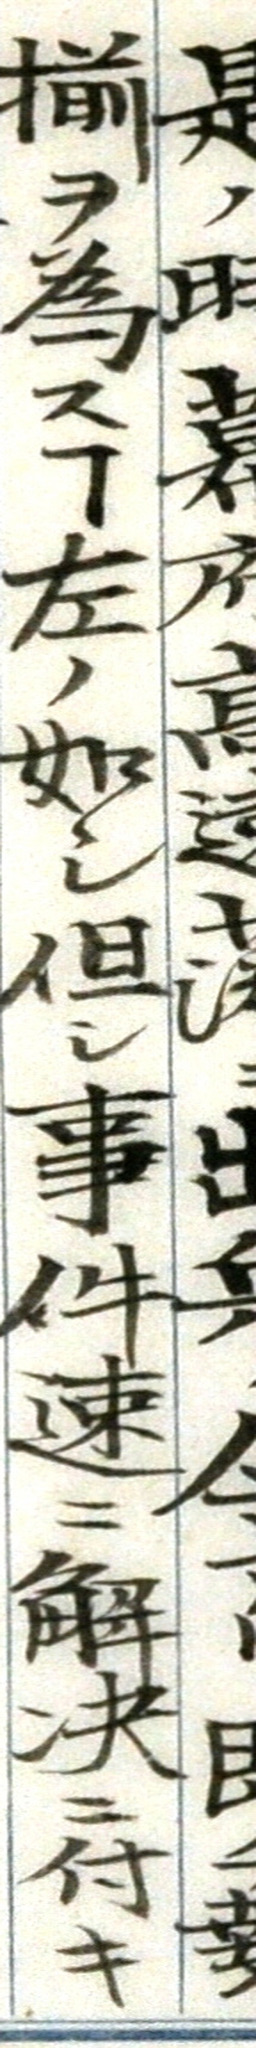揃ヲ為ス事左ノ如シ但シ事件速ニ解決ニ付キ
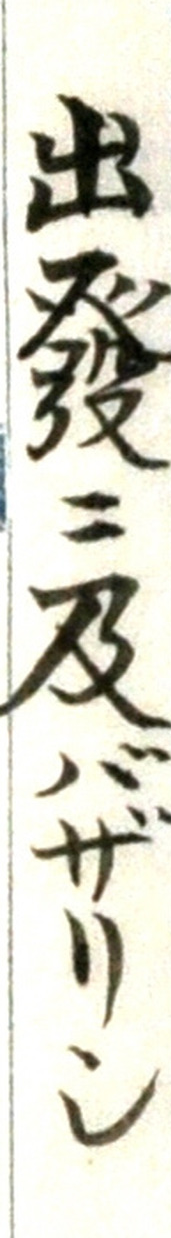出発ニ及バザリシ

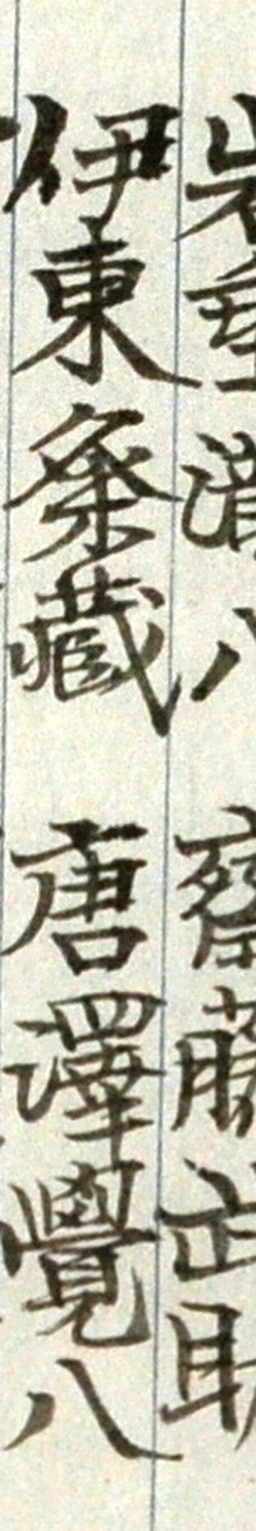伊東粂蔵唐沢覚八
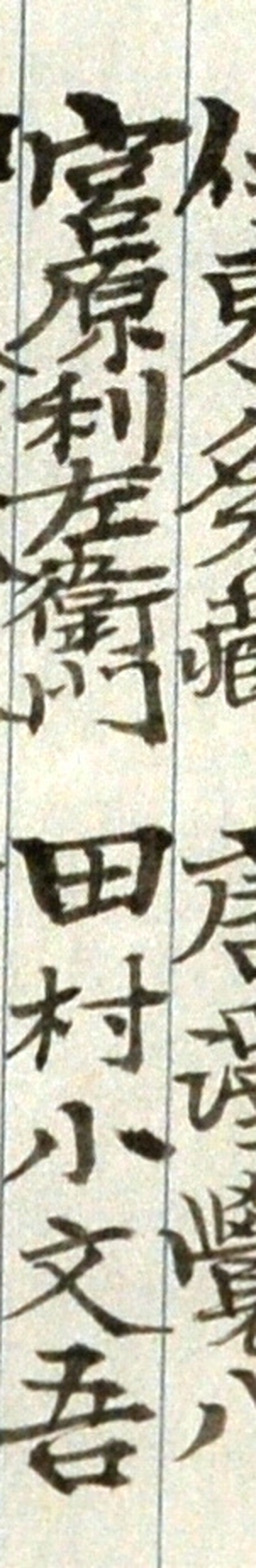宮原利左衛門田村小文吾
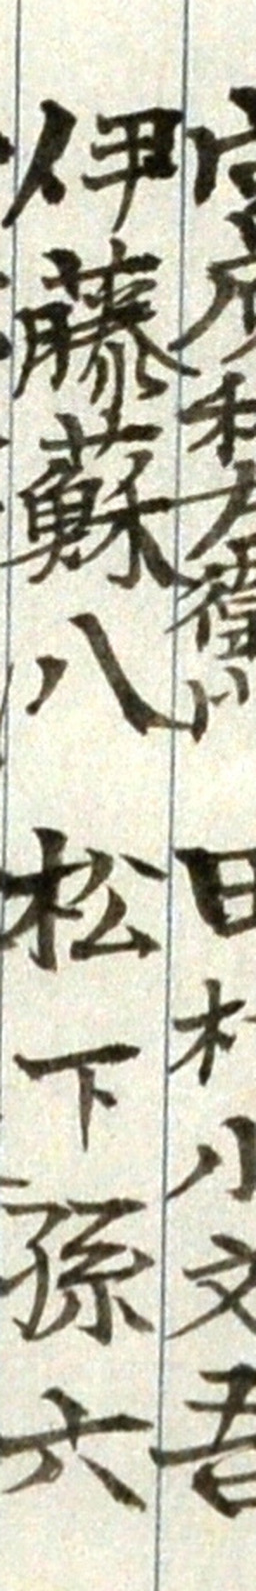伊藤蘇八松下孫六
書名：生麦事件ニ付動員
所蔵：伊那市立高遠町図書館・合同会社AMANE
